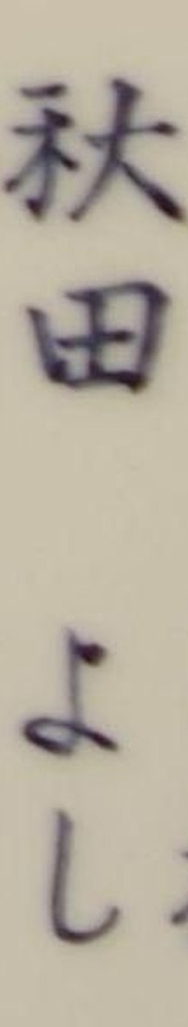秋田よし
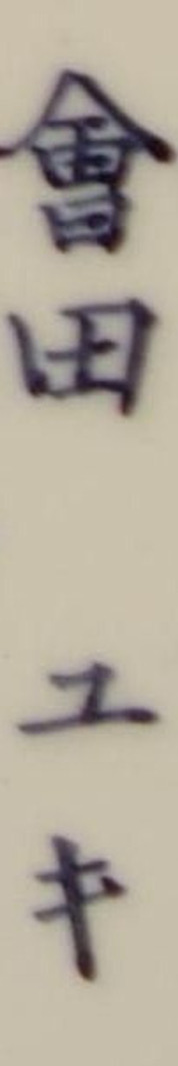会田ユキ
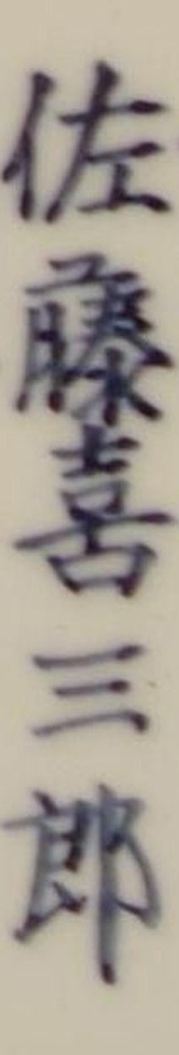佐藤喜三郎
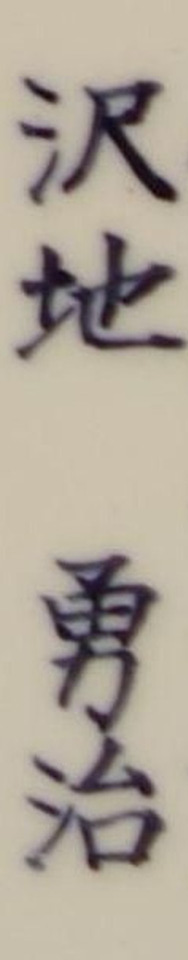沢地勇治
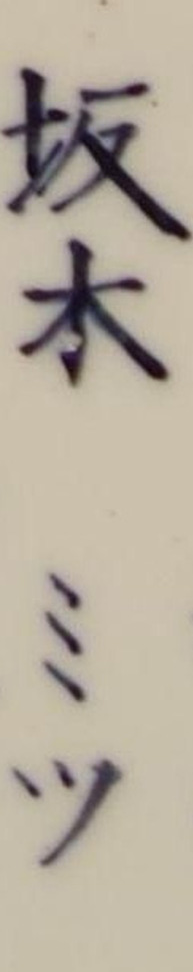坂木ミツ
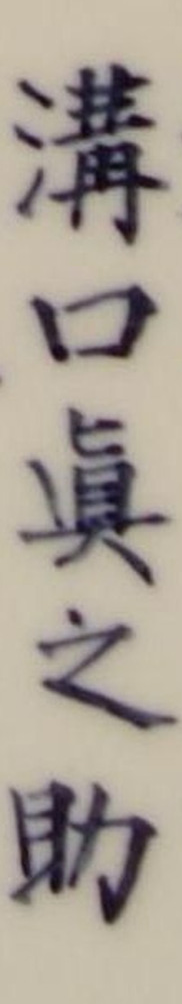溝口真之助
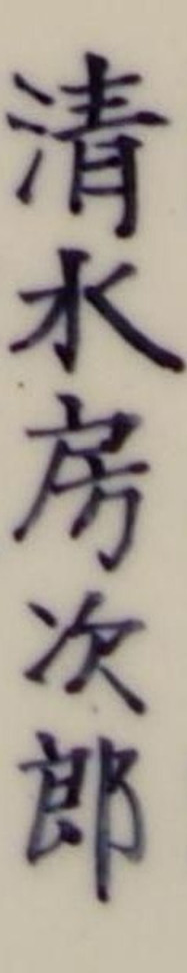清水房次郎
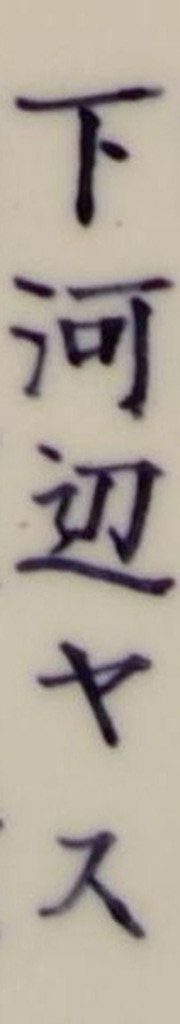下河辺ヤス
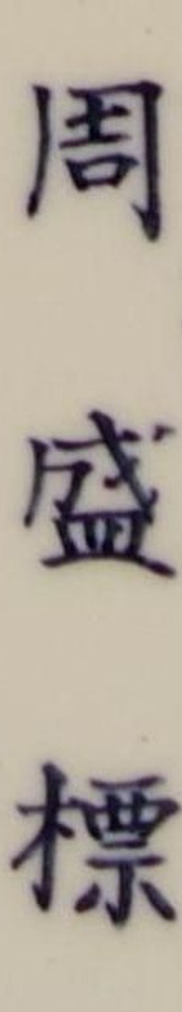周盛標
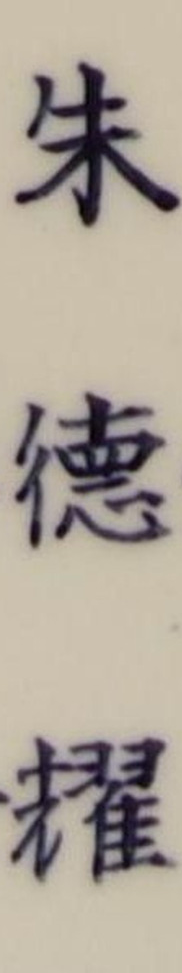朱徳耀
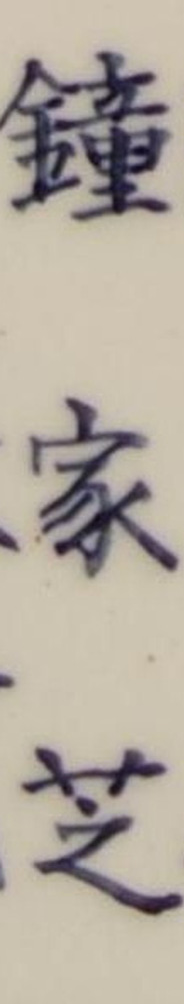鐘家芝
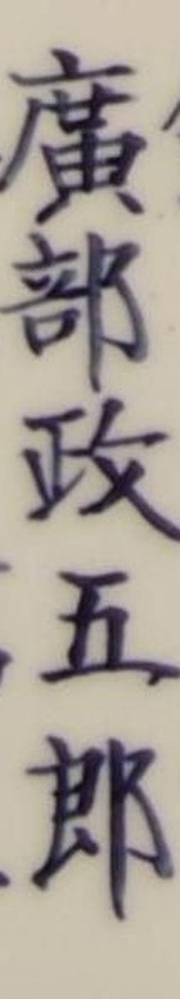広部政五郎
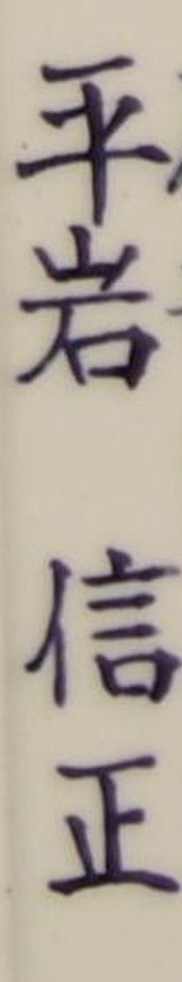平岩信正

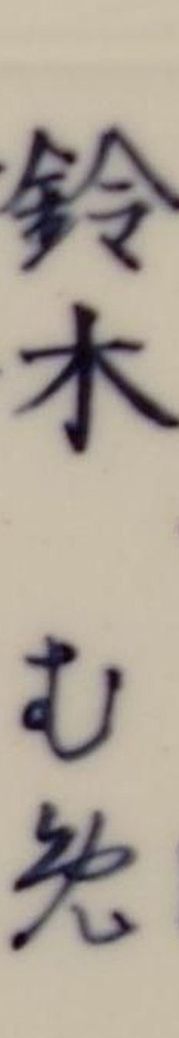鈴木むめ
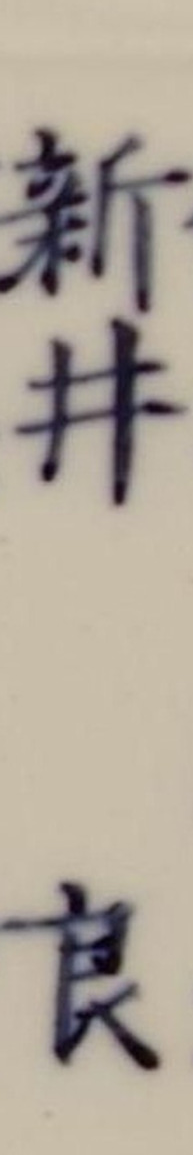新井良
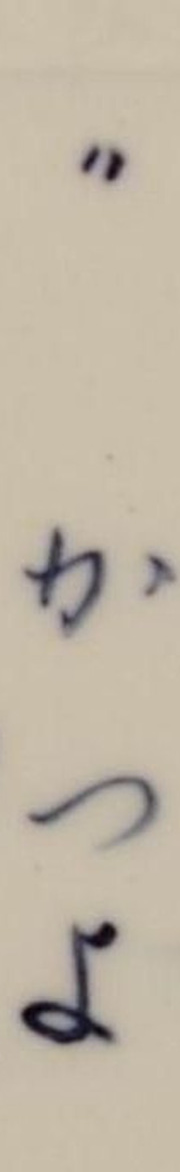かつよ
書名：M~S
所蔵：高野山金剛峯寺
